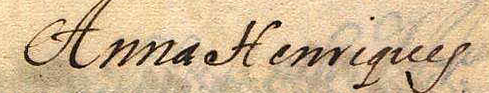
Anna Henriques
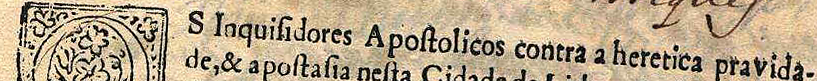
OS Inquisidores Apostolicos contra a heretica pravida
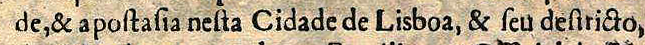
de, & apostasia nesta Cidade de Lisboa, & seu destricto,
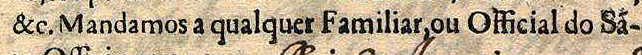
&c. Mandamos a qualquer Familiar, ou Official do Sā
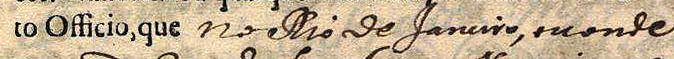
to Officio, que no Rio de Janeiro, ou onde
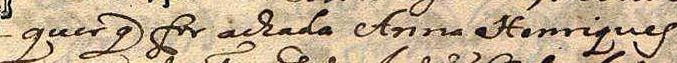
quer q̄ for achada Anna Henriques
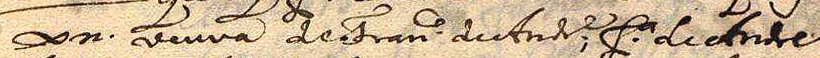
xn. veuva de Fran.co de Andr.e, f.a de Andre
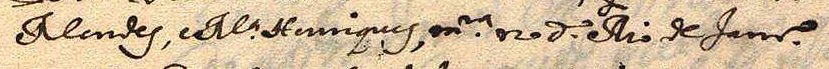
Mendes, e M.a Henriques, m.ra no d.o Rio de Janr.o
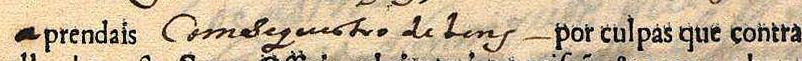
a prendais Com sequestro de bens - por culpas que contra
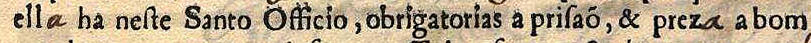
ella ha neste Santo Officio, obrigatorias a prisaõ, & preza a bom
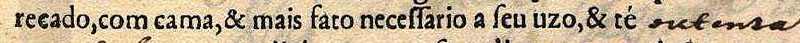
recado, com cama, & mais fato necessario a seu uzo, & té outenta
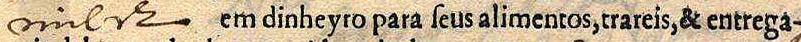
mil rz em dinheyro para seus alimentos, trareis, & entrega
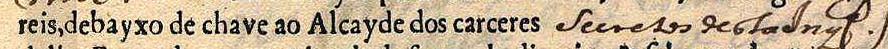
reis, debayxo de chave ao Alcayde dos carceres secretos desta InqÇaõ.
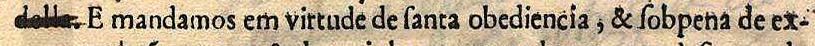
della. E mandamos em virtude de santa obediencia, & sob pena de ex
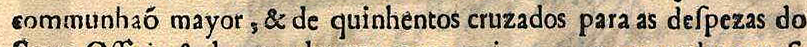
communhaõ mayor, & de quinhentos cruzados para as despezas do
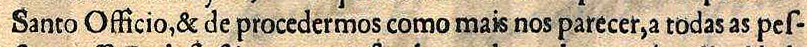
Santo Officio, & de procedermos como mais nos parecer, a todas as pes
